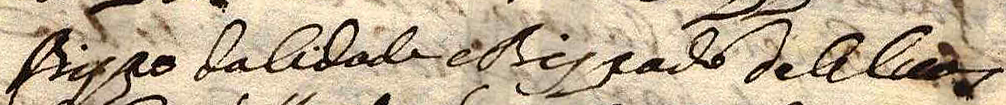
Bispo da Cidade e Bispado de Eluas
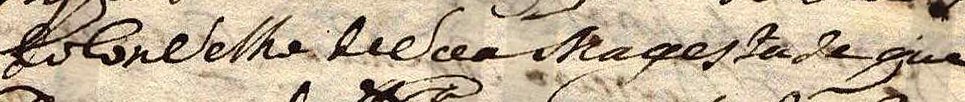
do Conselho de Sua Magestade que
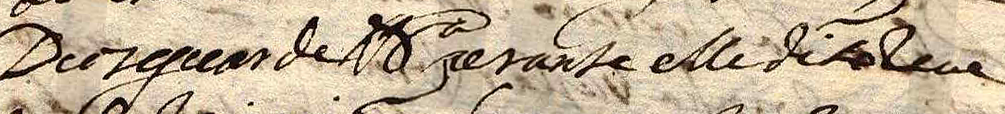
Deos guarde &a perante elle dito Reue
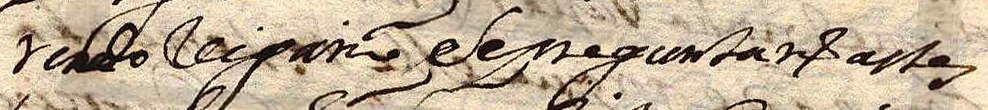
rendo Vigario Se preguntaraõ as tes
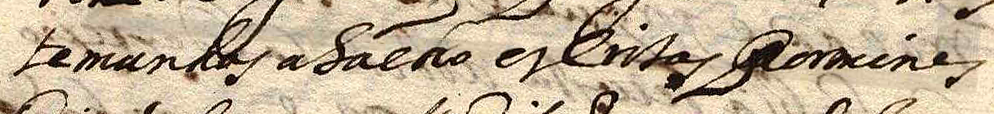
temunhas abacho escritas pro min es
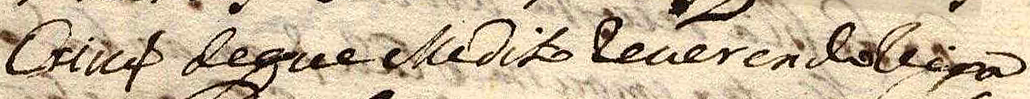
Criuaõ de que elle dito Reuerendo Viga
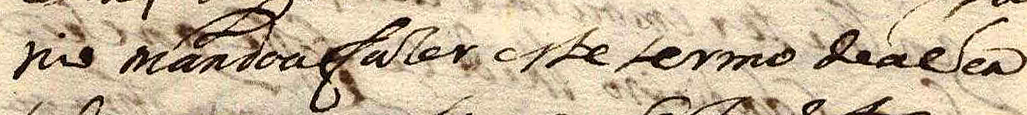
rio mandou fazer este termo de aSen
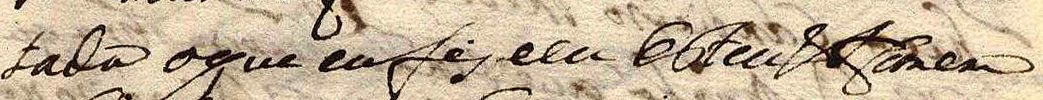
tada o que eu fis e eu Esteuaõ Homem
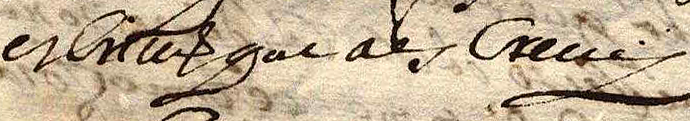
esCriuaõ que a esCreuy
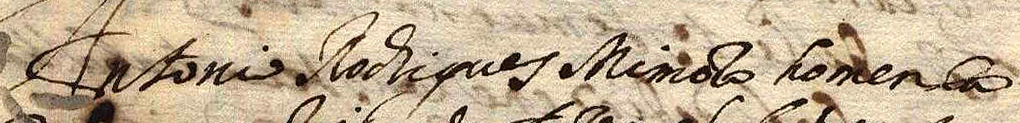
Antonio Rodrigues MimoZo homen Ca
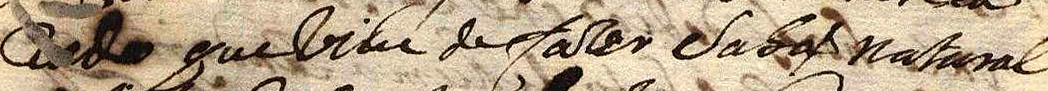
Zado que viue de fazer sabaõ natural
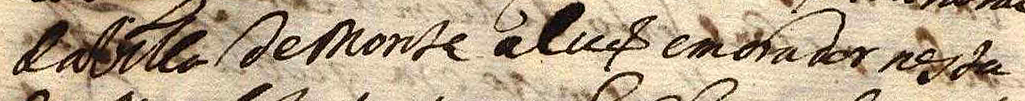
da villa de Monte aluaõ e morador nesta
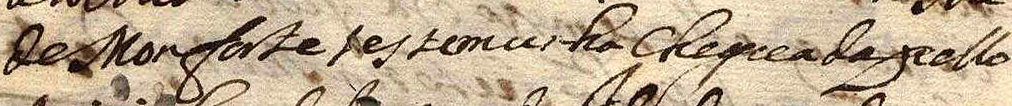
de Monforte testemunha cheguada pello
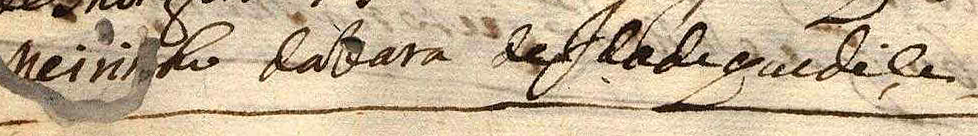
Meiri_ho da Vara de Jdade que dice
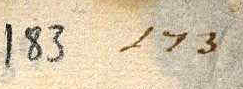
173
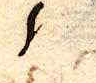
1
